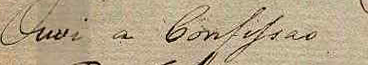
Ouvi a Confissao
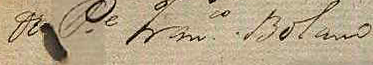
do P.e Fran.co Boland
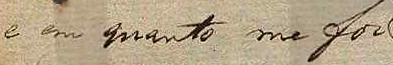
e emquanto me for
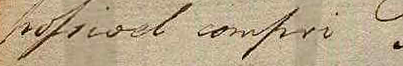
possivel compri
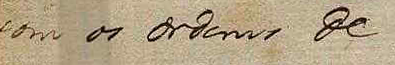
com os ordems de
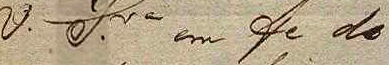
V. S.ra em fe do
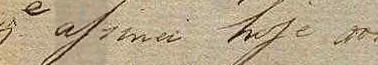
qe assinei hoje aos
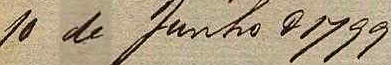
10 de Junho d 1799
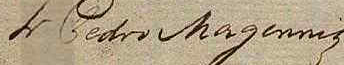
Ir Pedro Magennis
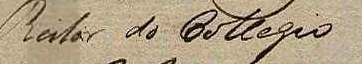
Reitor do Collegio
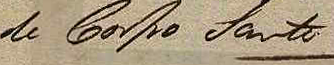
de Corpo Santo
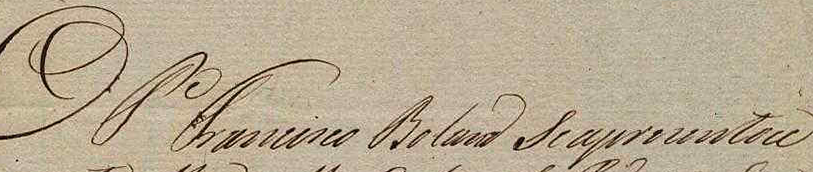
O Pe Francisco Boland se aprezentou
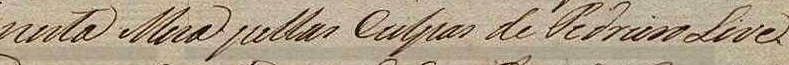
nesta Meza pellas Culpas de Pedreiro Live
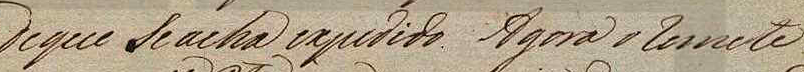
de que se acha expedido. Agora o Remete
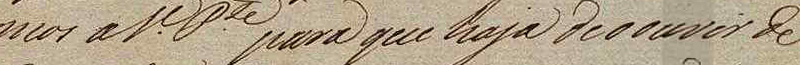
mos a V. P.te para que haja de o ouvir de
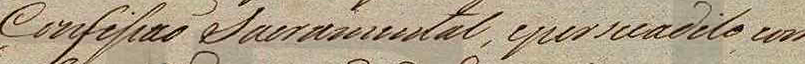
Confissaõ Sacramental, e persuadilo com
